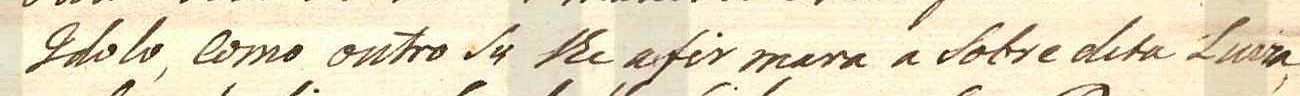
Idolo, como outrosy lhe afirmara a sobredita Luiza,
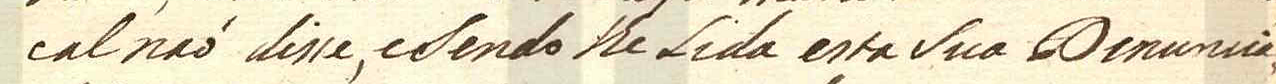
e al naõ disse, e Sendolhe Lida esta Sua Denuncia,
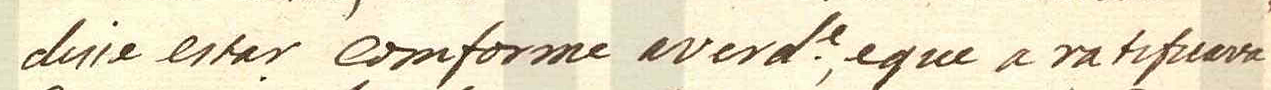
disse estar comforme a verd.e, e que a ratificava
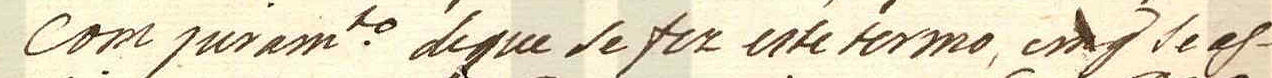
com juram.to de que se fez este termo, em q̄ se as
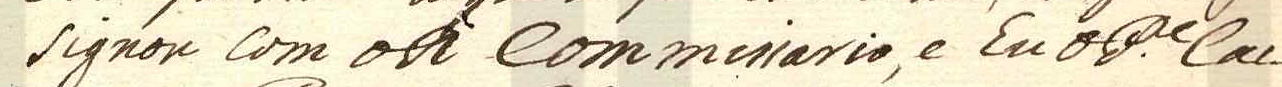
signou com o R Commissario, e Eu o P.e Cae
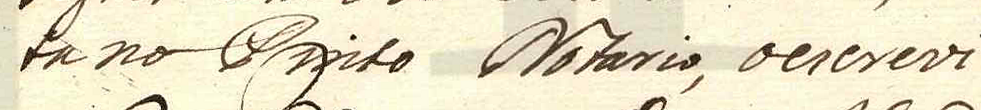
tano Pinto Notario, o escrevi
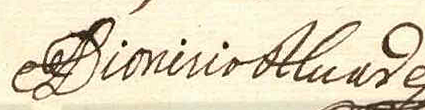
Dionisio Aluares
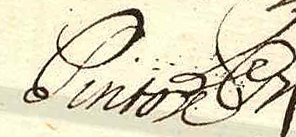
Pinto xer
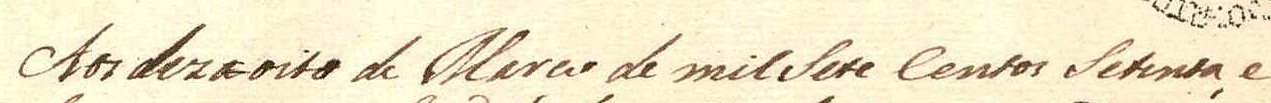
Aos dezaoito de Março de mil SeteCentos setenta, e
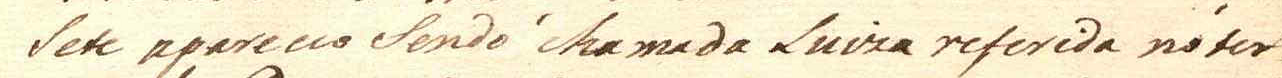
sete apareceo sendo chamada Luiza referida no ter
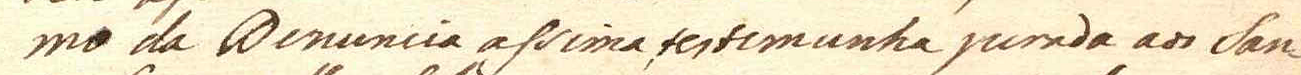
mo da Denuncia assima, testemunha jurada aos San
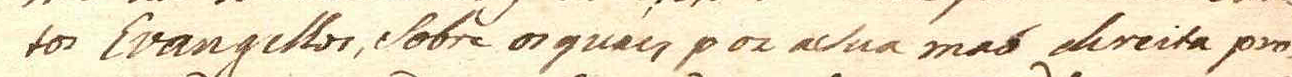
tos Evangelhos, sobre os quais poz a sua maõ direita pro
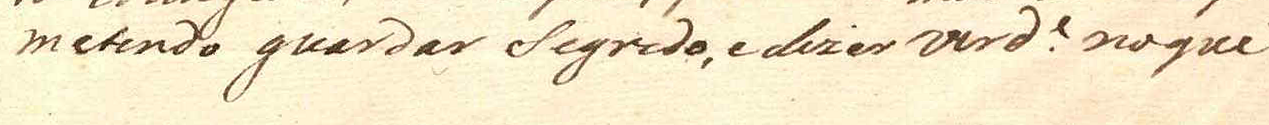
metendo guardar segredo, e dizer verd.e no que
